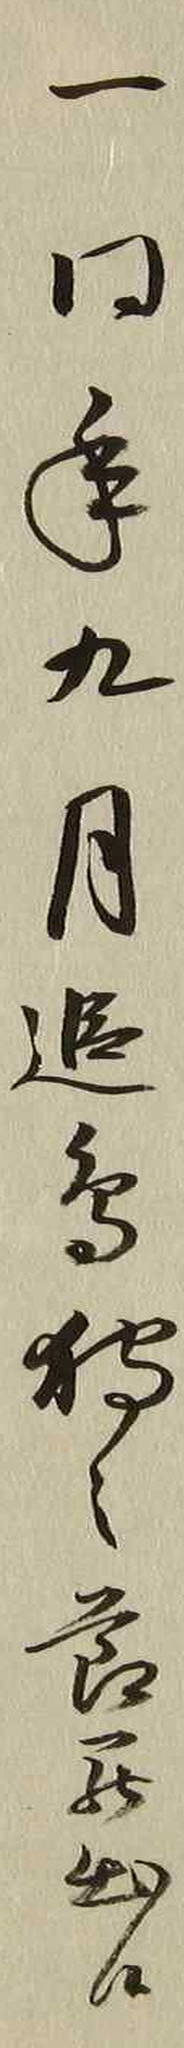一同年九月追鳥狩之節罷出候
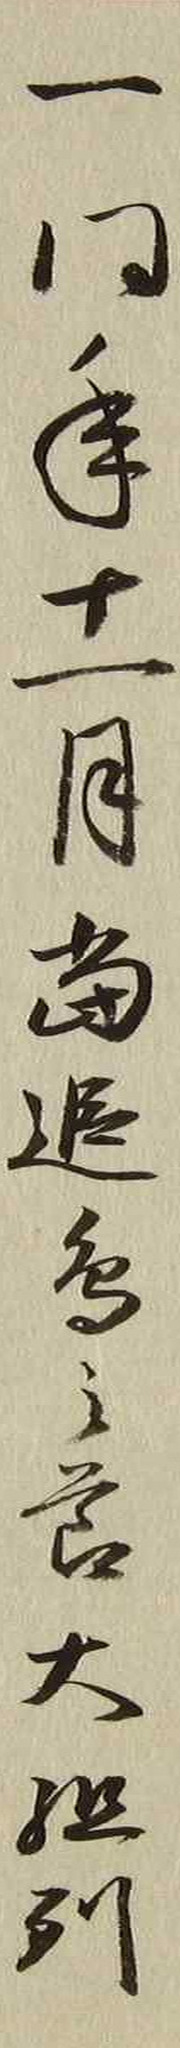一同年十一月当追鳥之節大組列
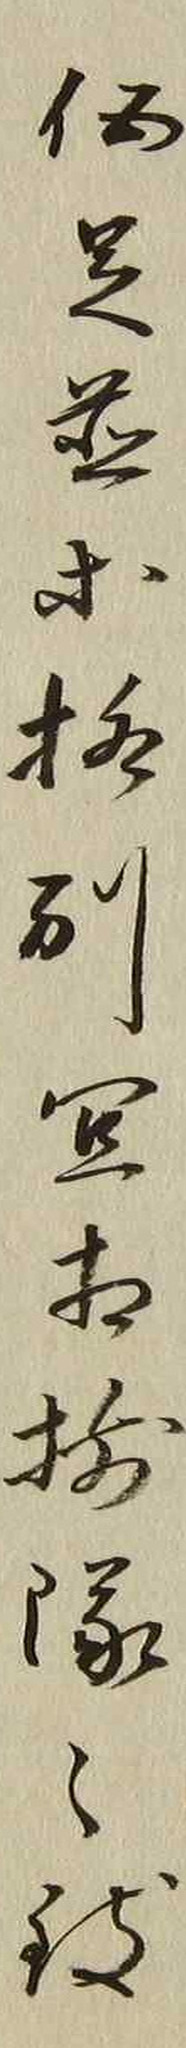伍足並等格別宜相揃隊々致
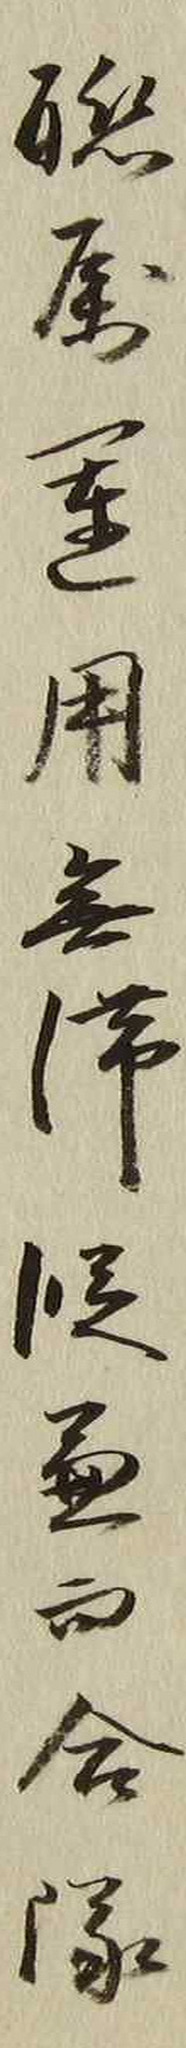聯属運用無滞段兼而合隊
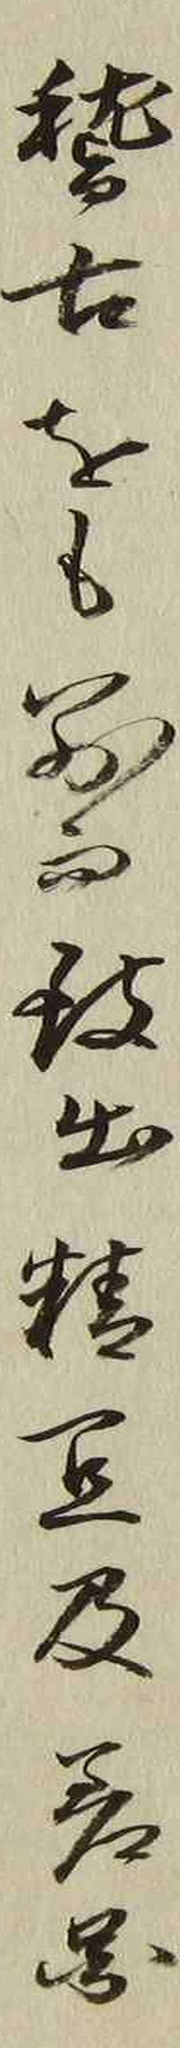稽古をも別而致出精宜及差図
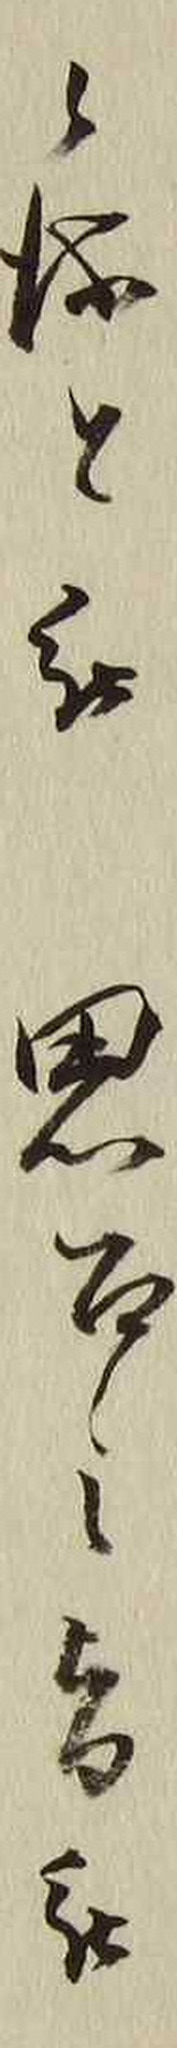之儀と被思召之旨被
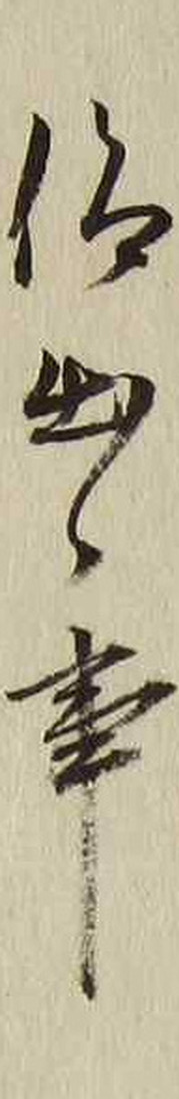仰出候事
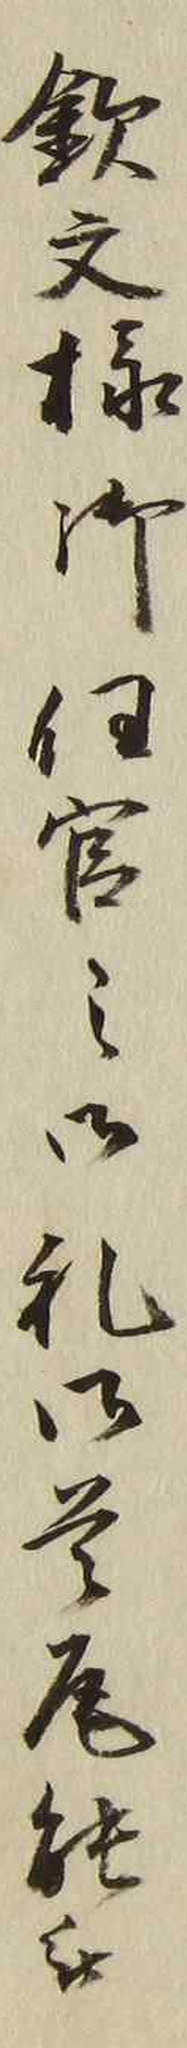欽文様御任官之御礼御首尾能被
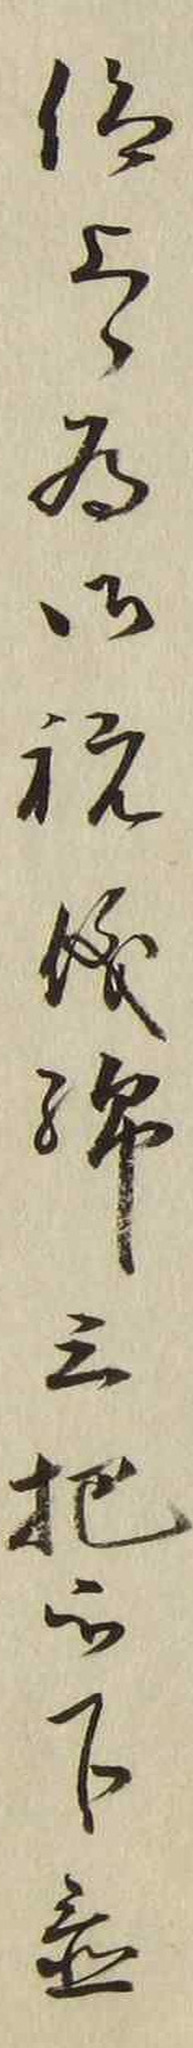仰上候為御祝儀綿三把被下置

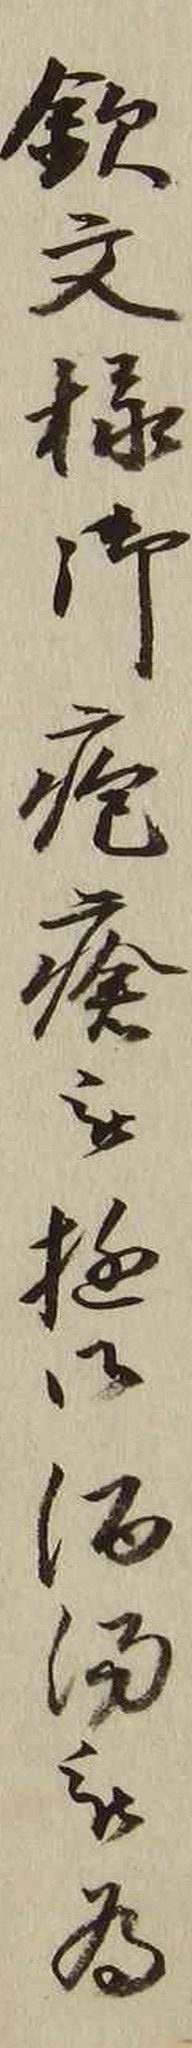欽文様御疱瘡被遊御酒湯被為
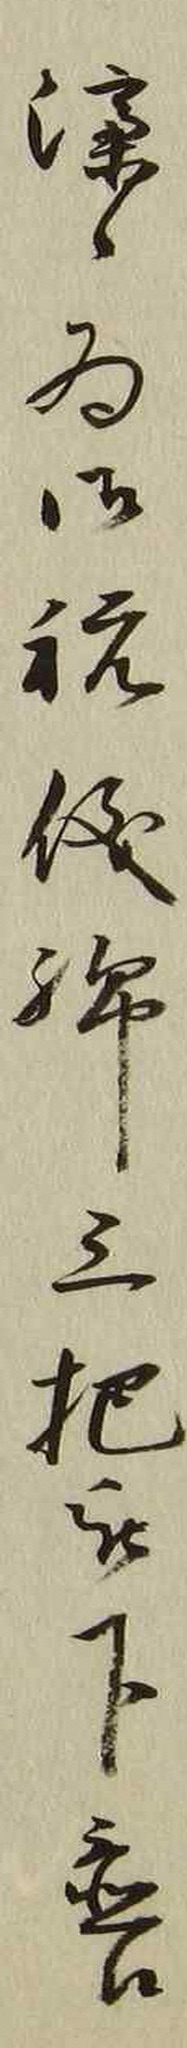済候為御祝儀綿三把被下置候
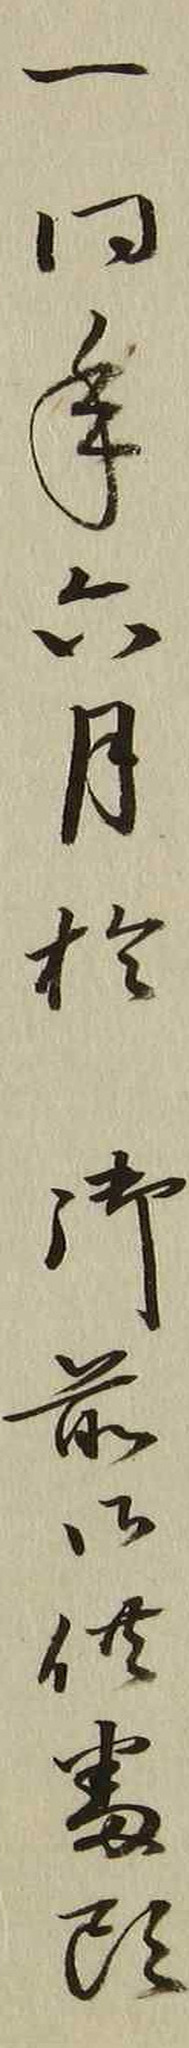一同年六月於御前御供番頭
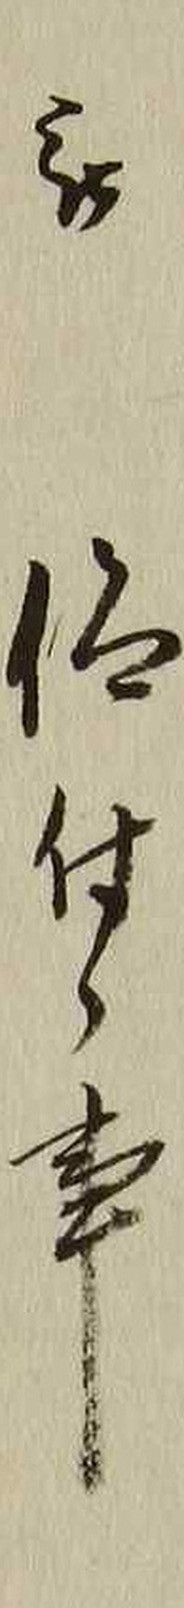被仰付候事
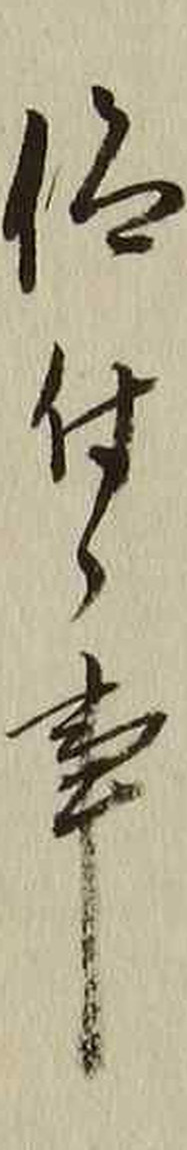仰付候事
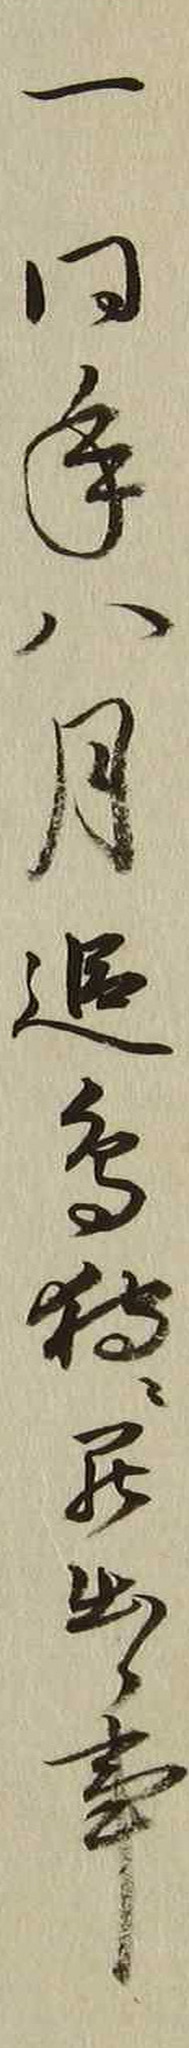一同年八月追鳥狩ニ罷出候事
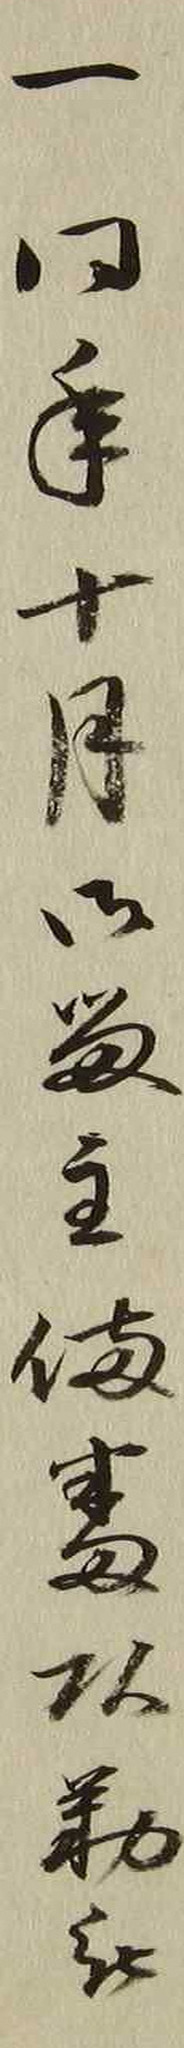一同年十月御留主備番頭勤被
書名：諸士系譜　巻之69　を之部3
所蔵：会津若松市立会津図書館
